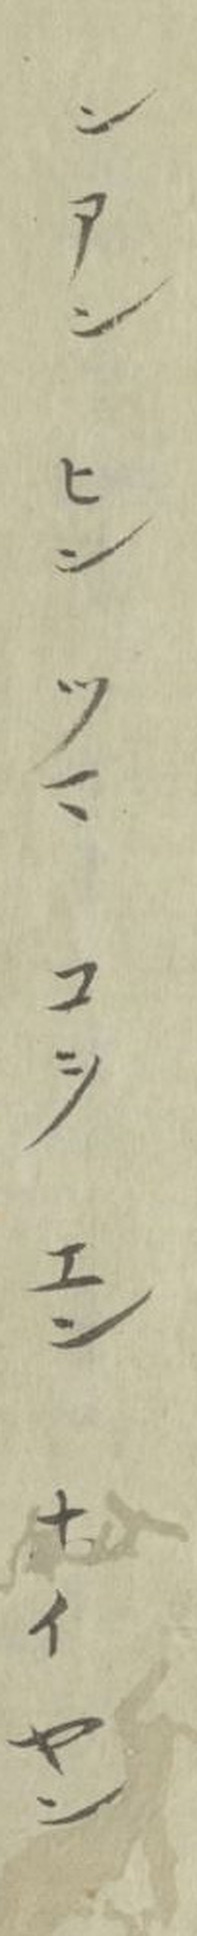ンアンヒンツマコヲエンホイヤン

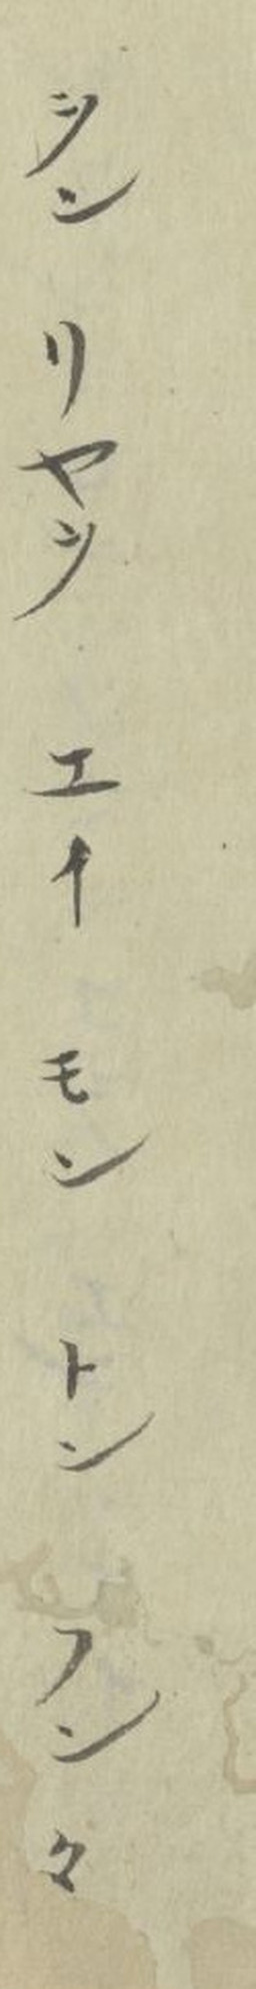ヲンリヤヲエイモントンフンタ
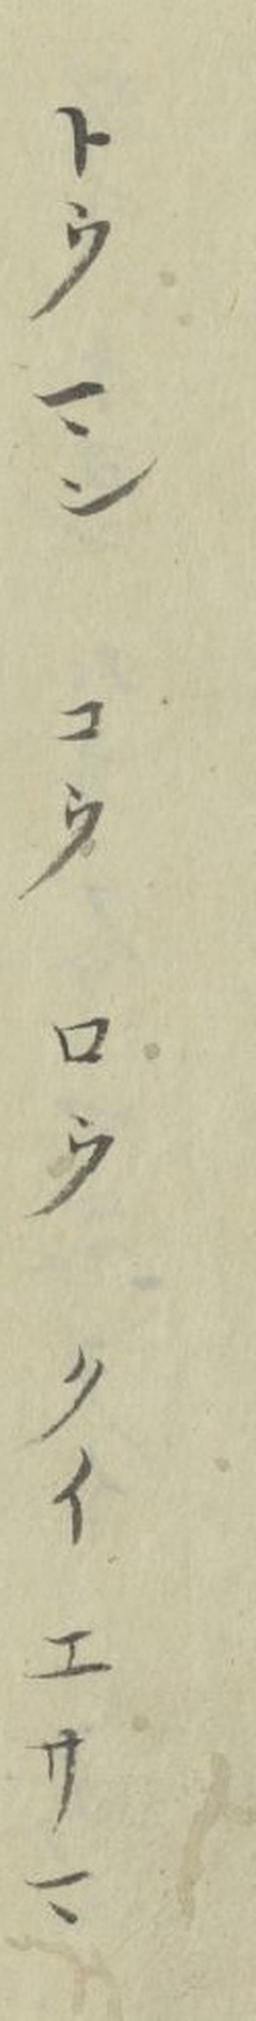トウマンコウロウクイエサマ
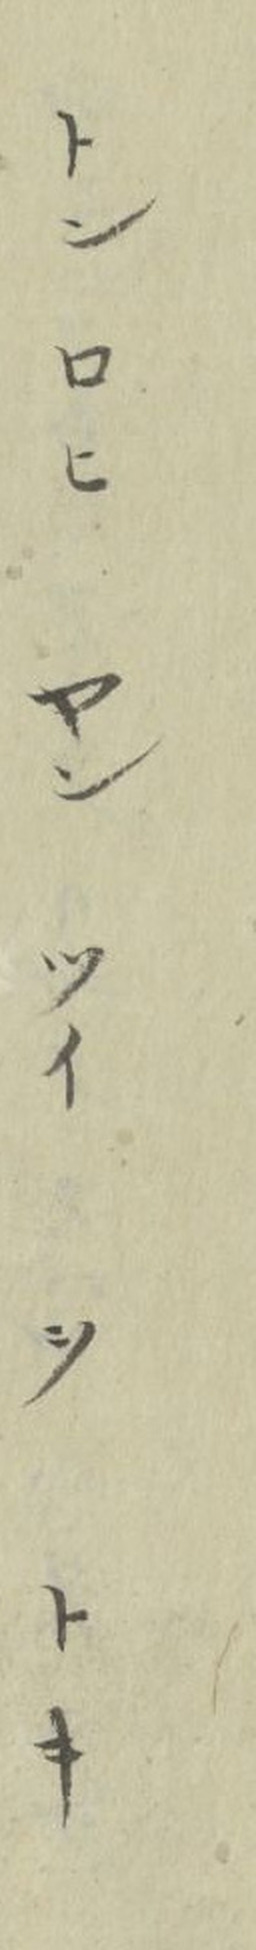トンロヒヤンツイヲトキ
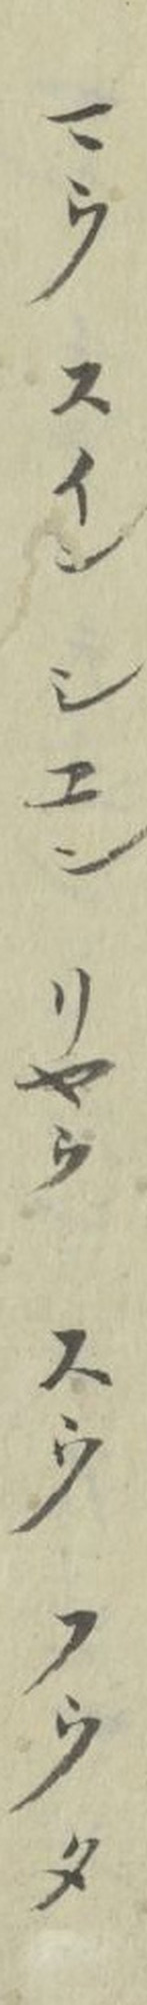マウスインシヱンリヤウスウフウタト
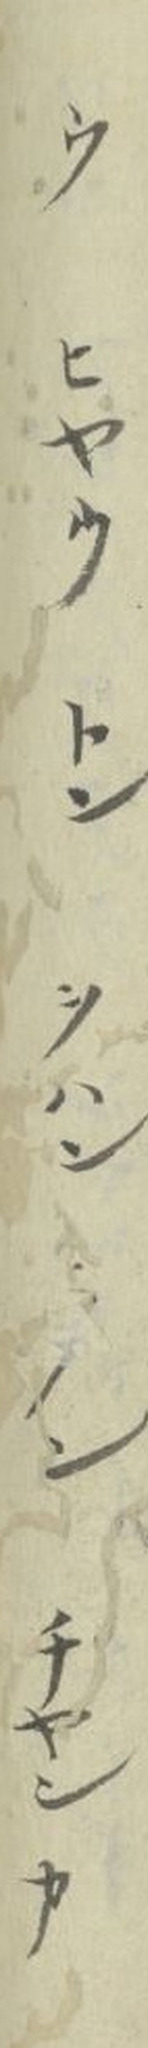ウヒヤウトンヲハンテンチヤンカ
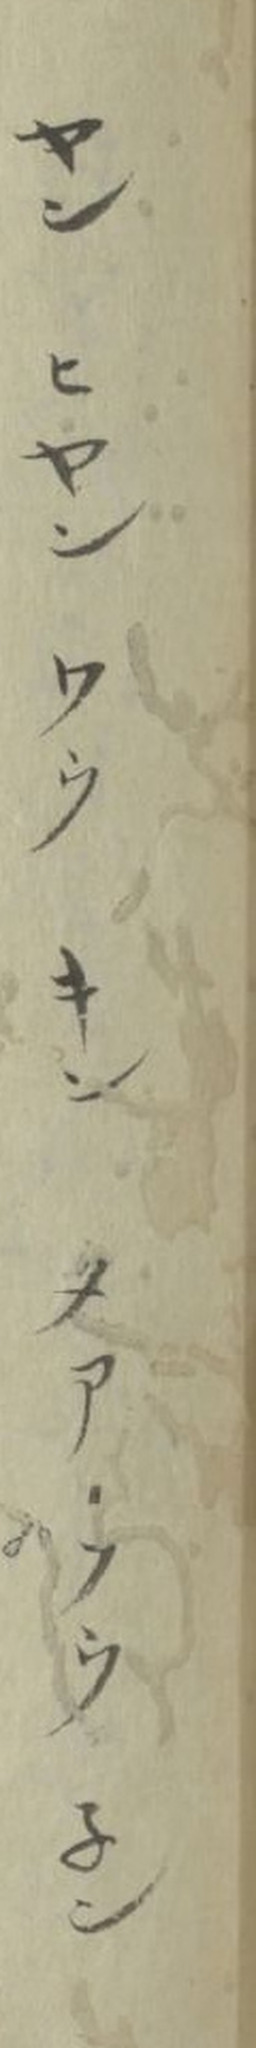ヤンヒヤンワウキンタアクウネン
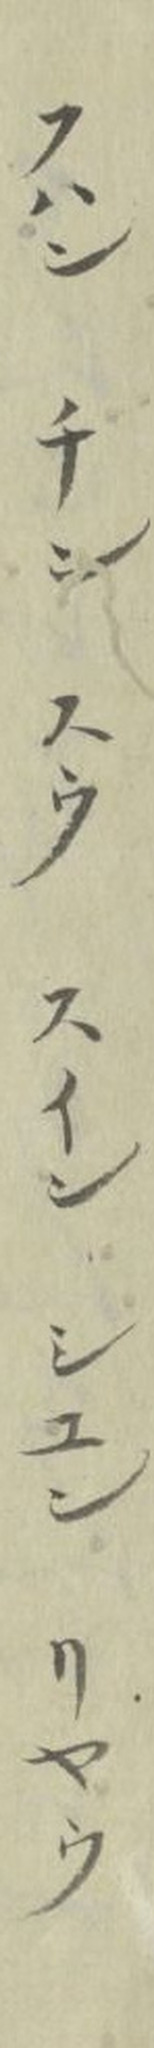フハンチンスウスインシユンリヤウ
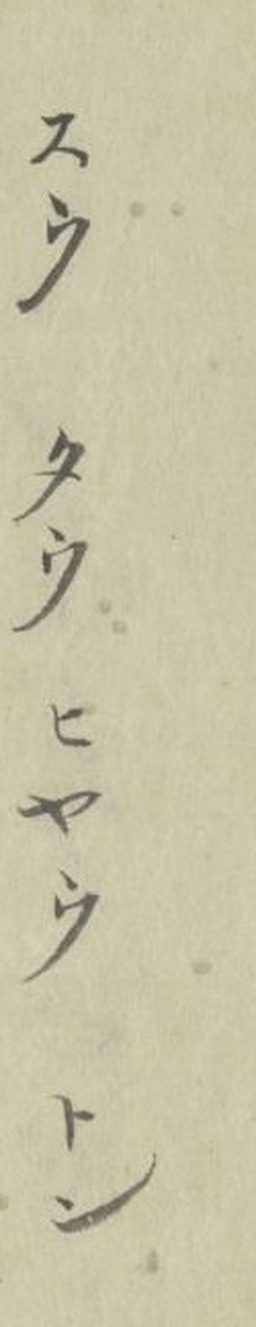スウタウヒヤウトン
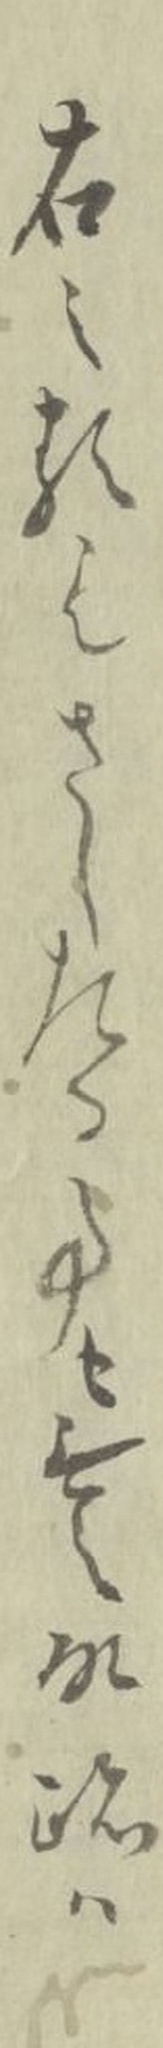右之類にてさしたる事は無之故跡は
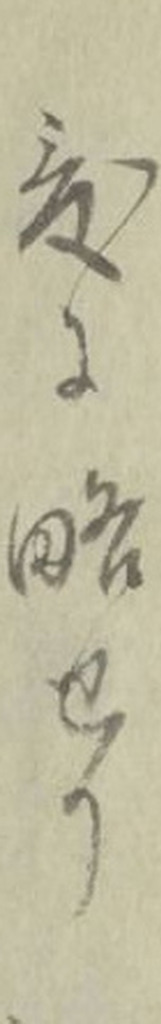爰に略せり

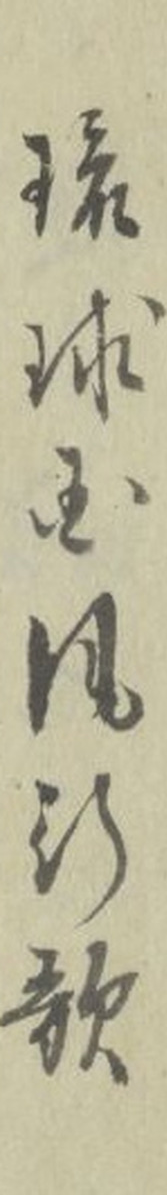琉球国風行歌
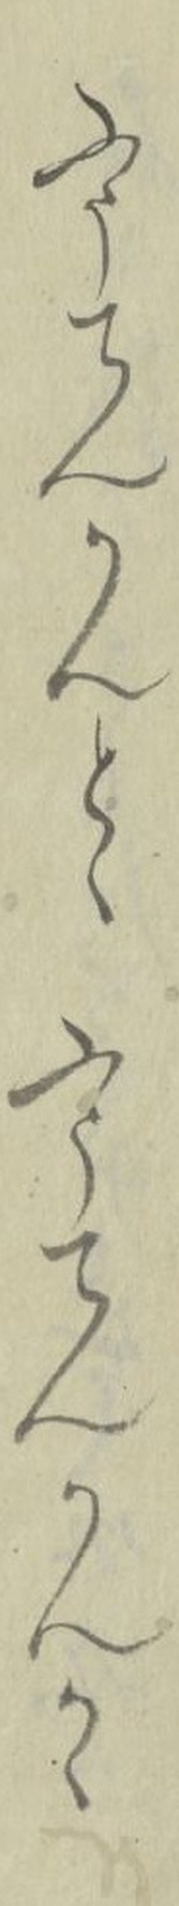ふうてんかんとゝふうてんかんかゝ
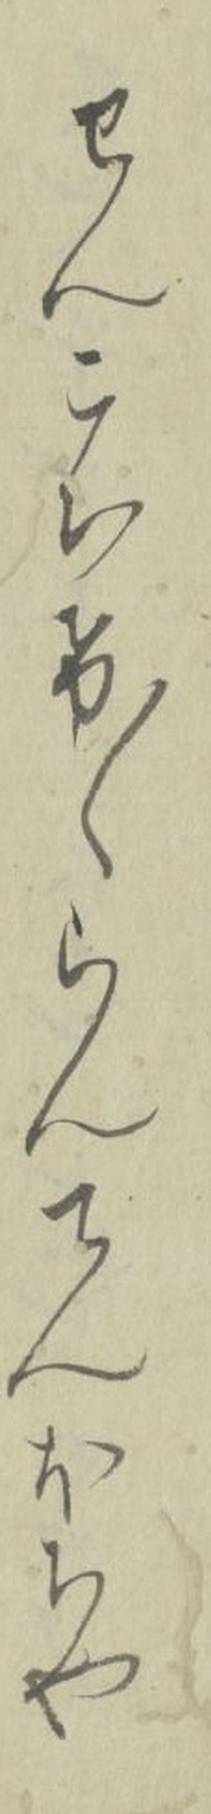せんこちけ〳〵らんてんほちや
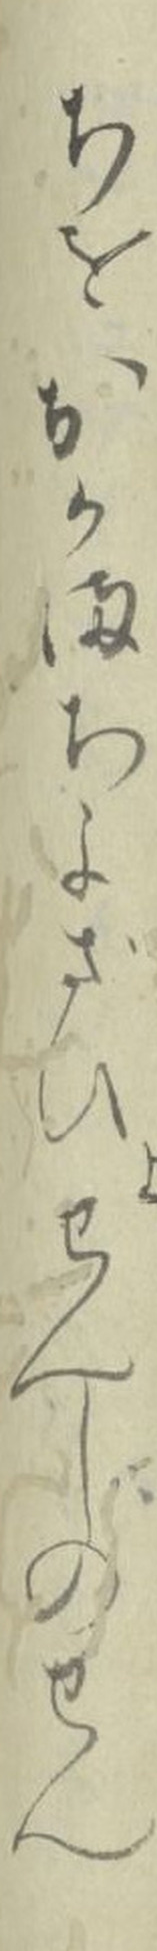ちをおかまちよさひせんしのせん
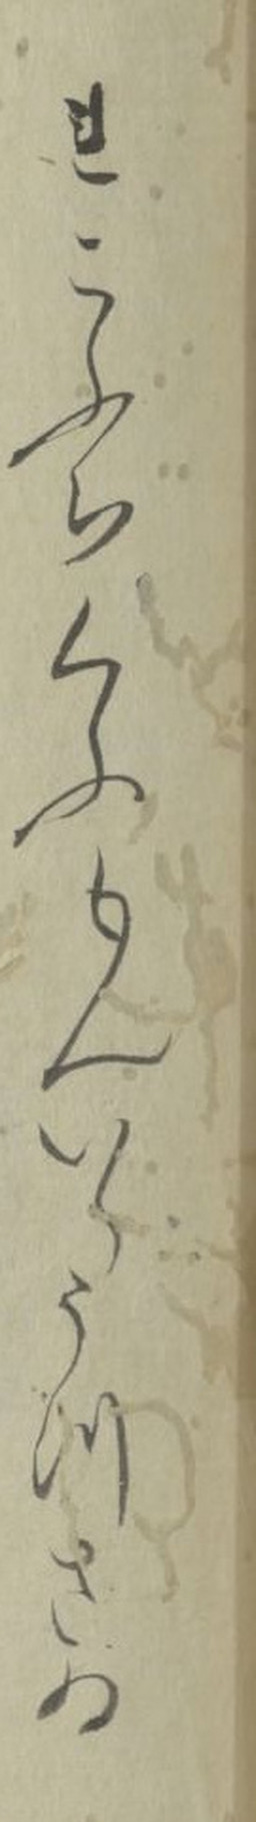れこふちくふもんいううつさゐ
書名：琉球来朝記 自八至十四終
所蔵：University of the Ryukyus Library
